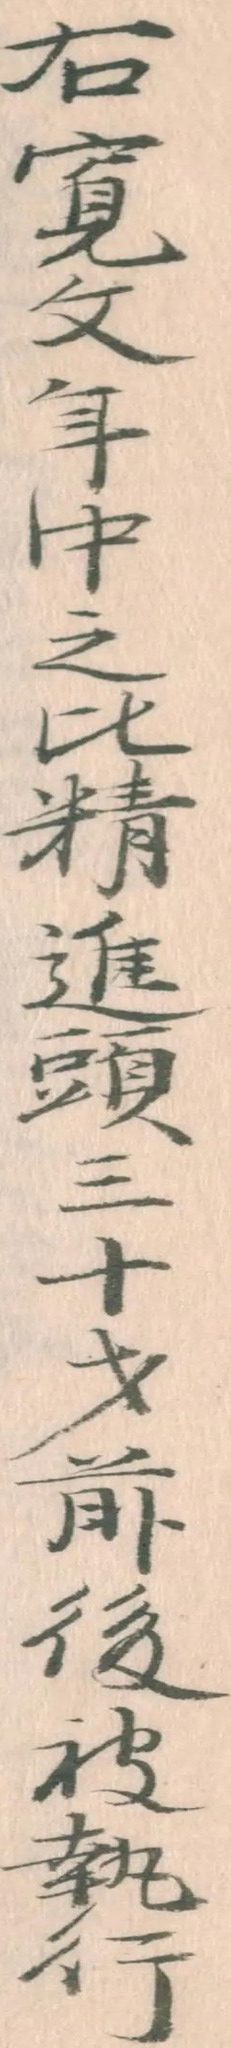右寛文年中之比精進頭三十才前後被執行
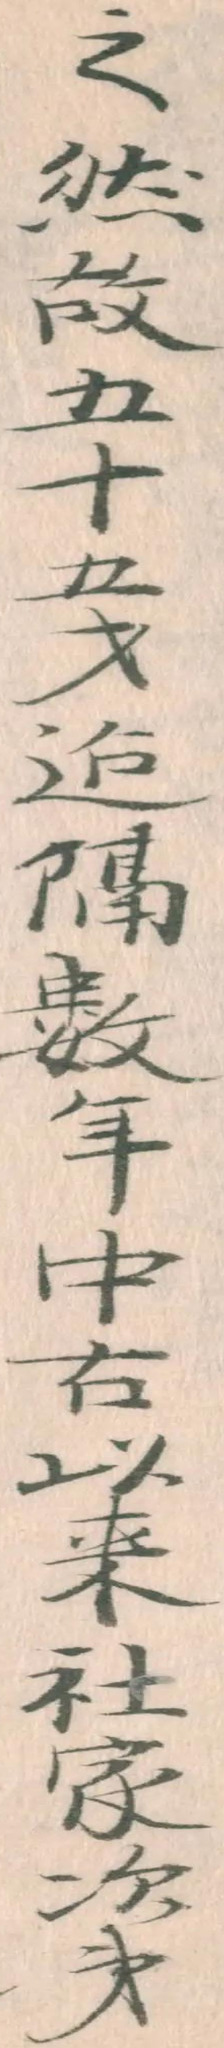之然故五十五才迄隔数年中古以来社家次第
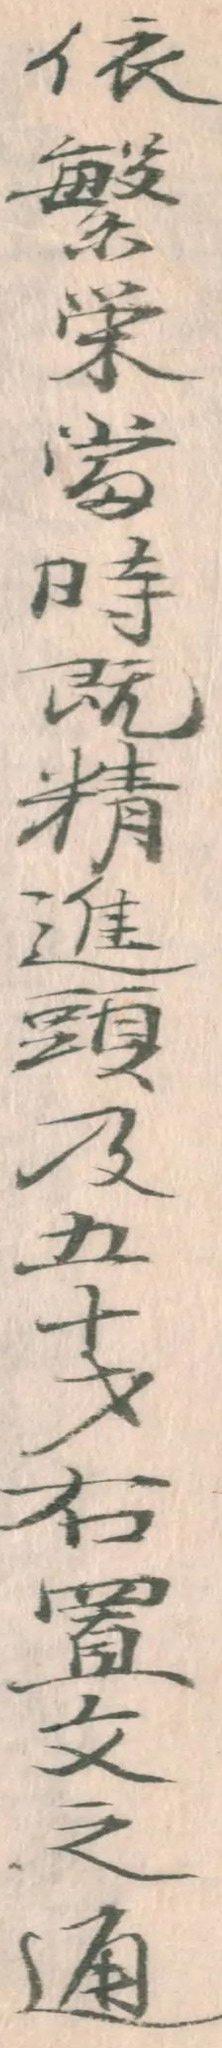依繁栄當時既精進頭及五十才右置文之通
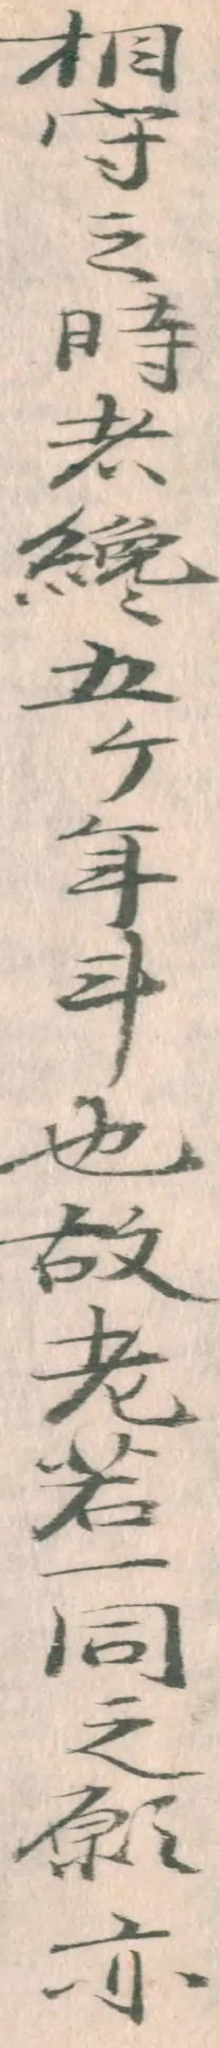相守之時者纔五ヶ年斗也故老若一同之願亦
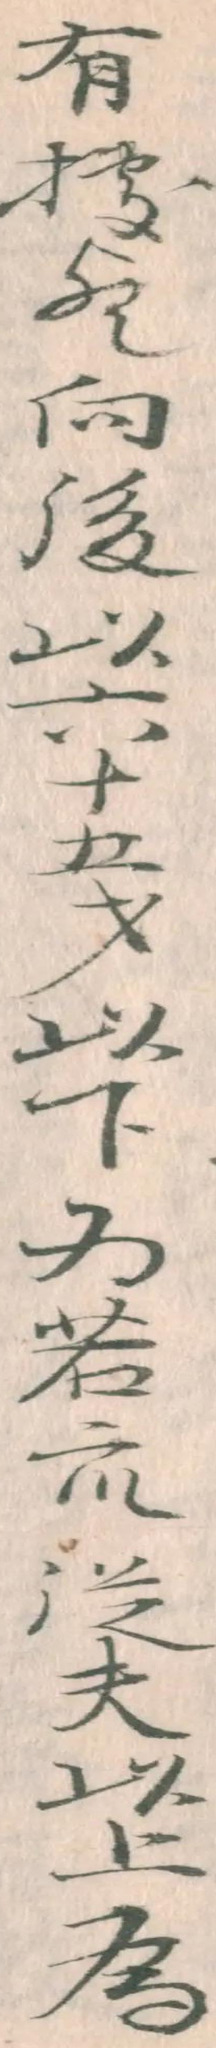有拠歟向後以六十五才以下為若衆従夫以上為
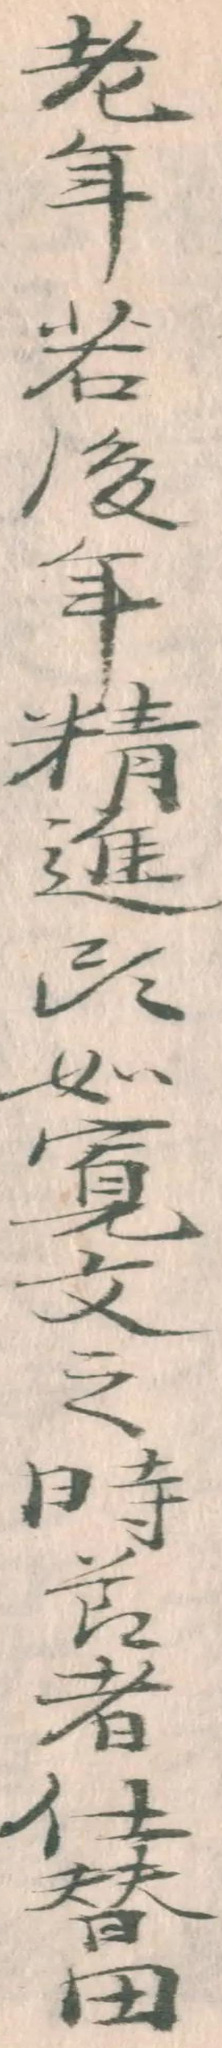老年若後年精進頭如寛文之時節者仕替田
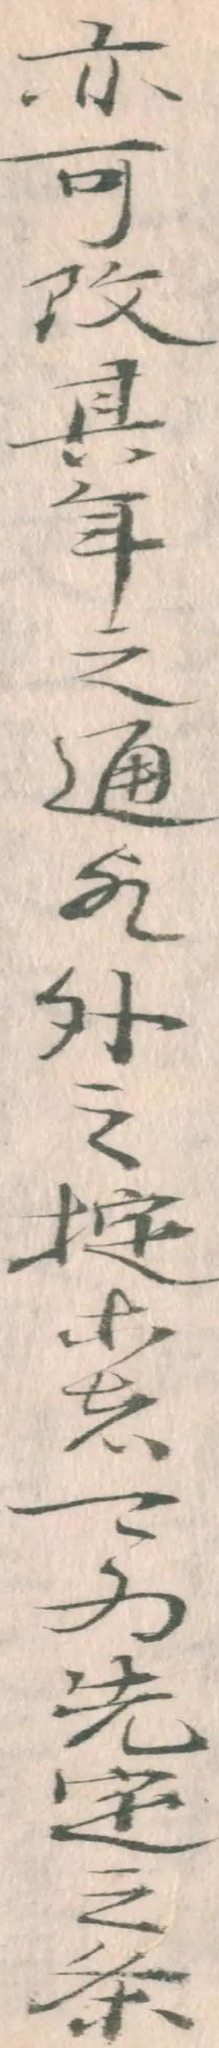亦可改其年之通歟外之掟等は可為先定之条
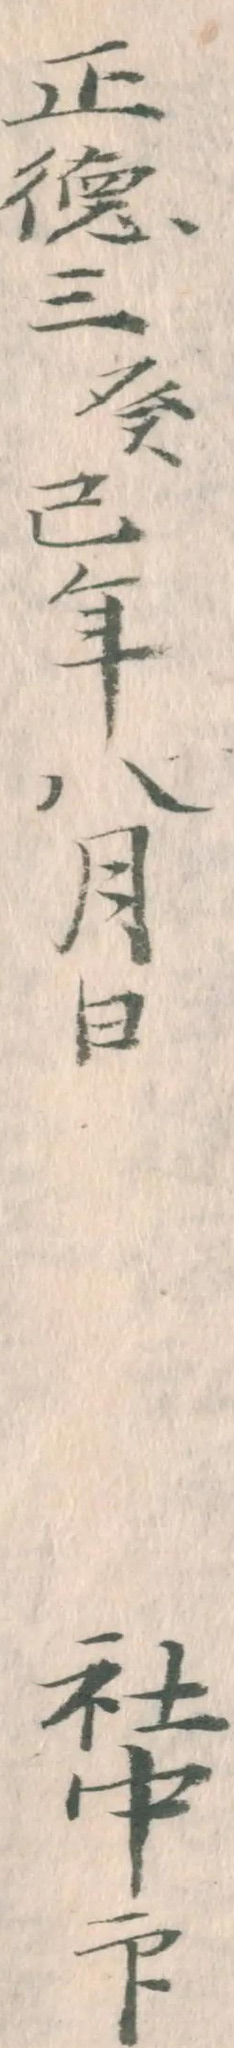正徳三癸巳年八月日社中印
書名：賀茂社記録. 第39冊
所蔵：国立国会図書館 National Diet Library, JAPAN
